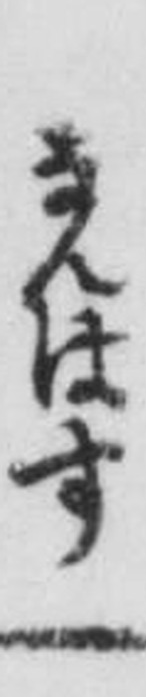なんはす
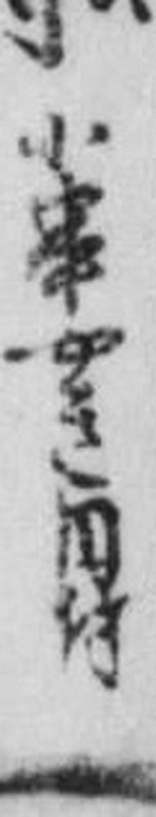鯛小串やき目付
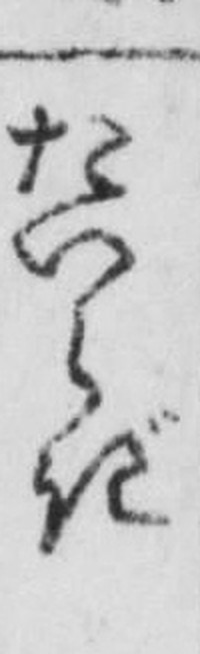たいらぎ
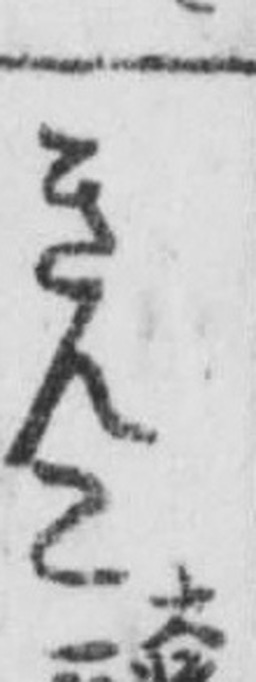きんこ
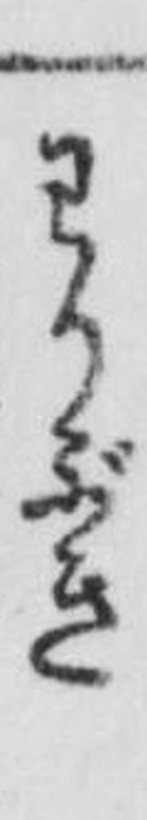わりぶき
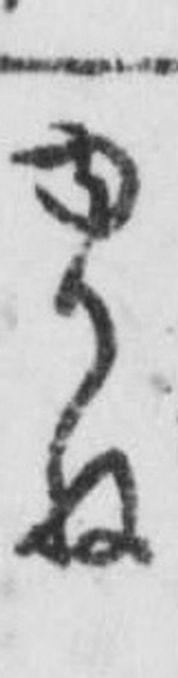ゆりね
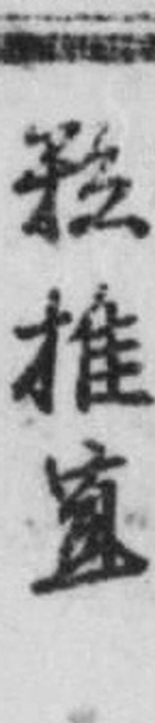粒椎茸
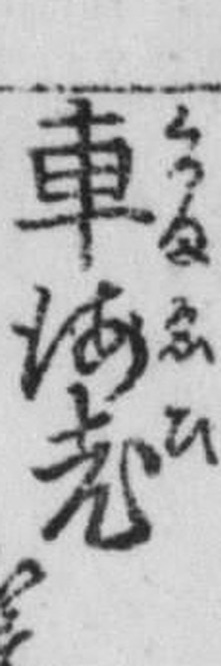車海老
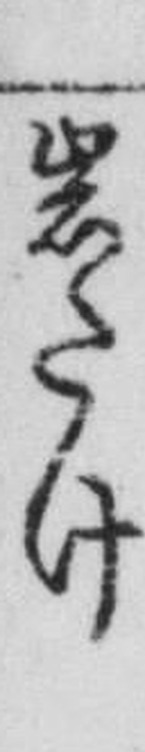岩たけ
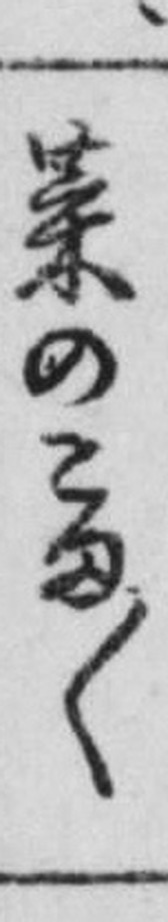菜のこま〳〵
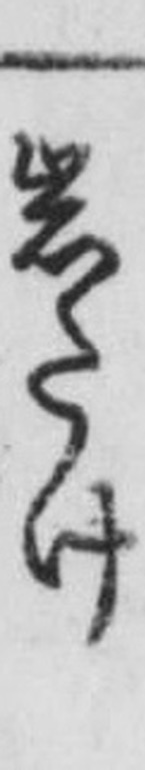岩たけ
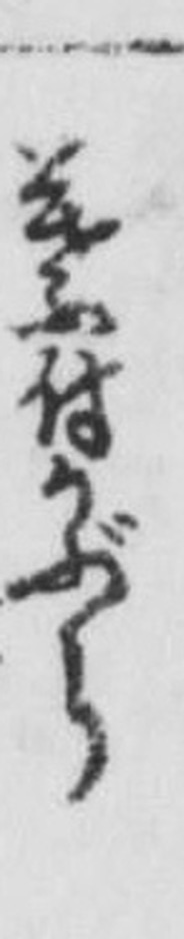葉付かぶら
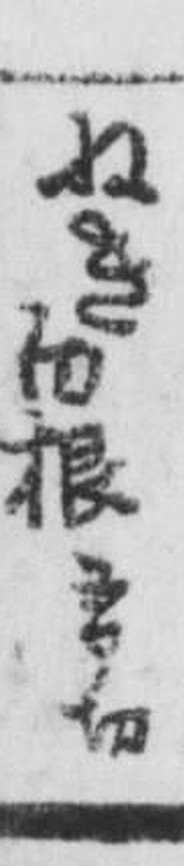ねき白根五部切
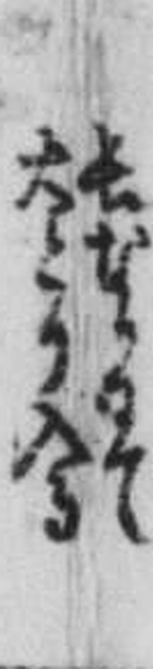火とり入る
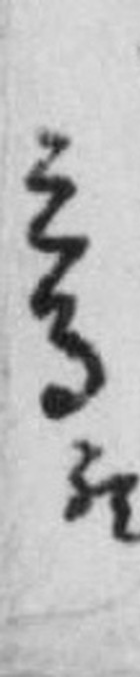みるか
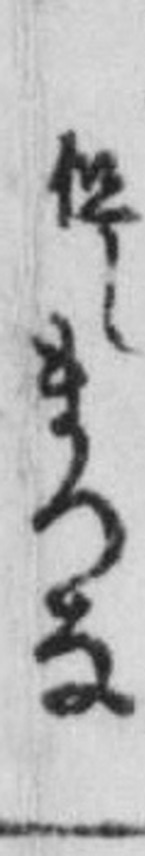但しまつな
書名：精進魚類間合料理/早速庖丁
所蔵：大阪府立大学学術情報センター 国文学研究資料館
